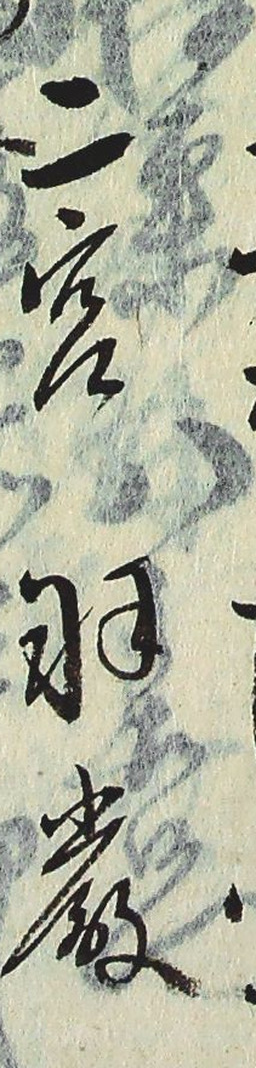二宮羽厳
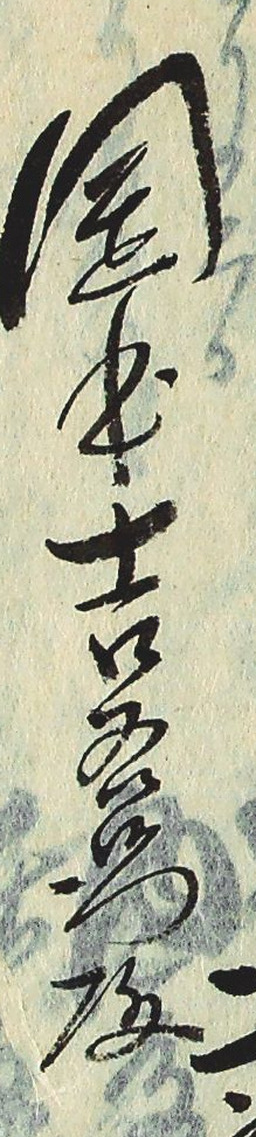岡本吉右衛門殿
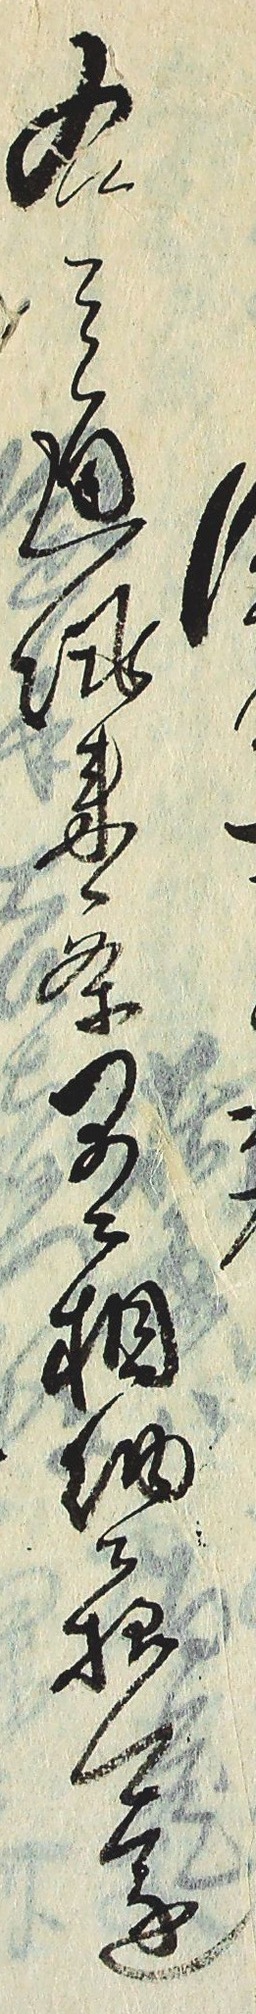右之通誂来候条早々相納候様可遂
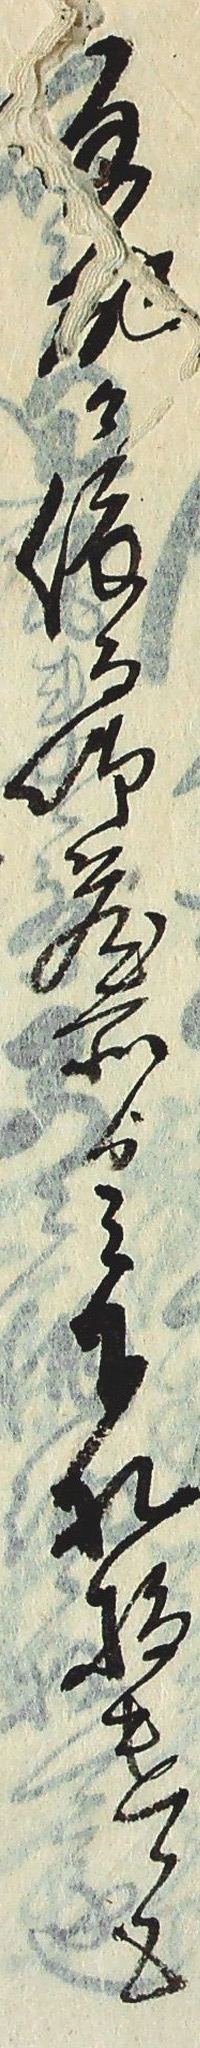手配候依て御蔵所ゟ之下札指遣候以上
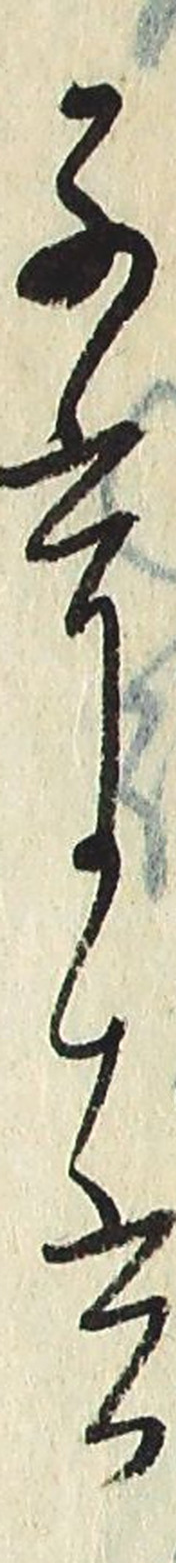子六月十六日

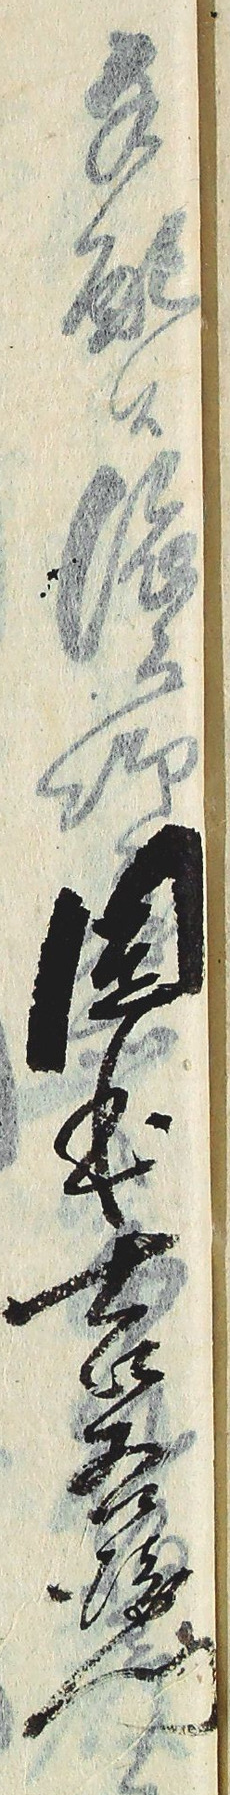岡本吉右衛門
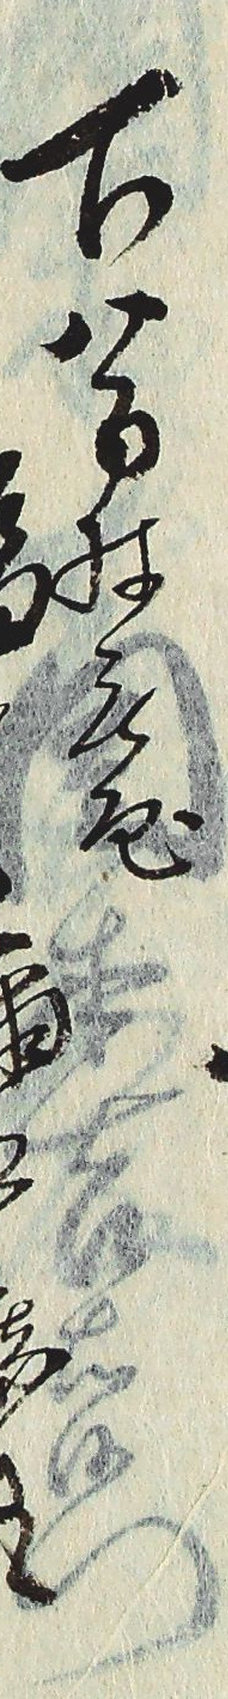下八万村庄屋
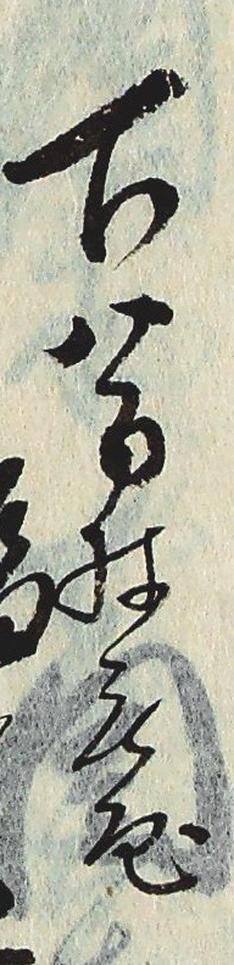下八万村庄屋
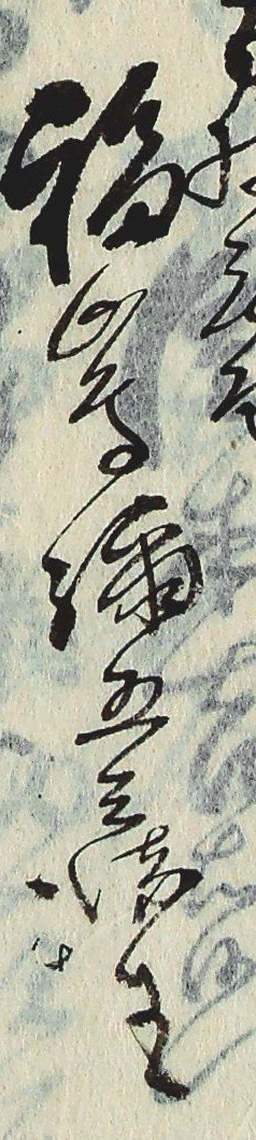福島弥五兵衛方へ
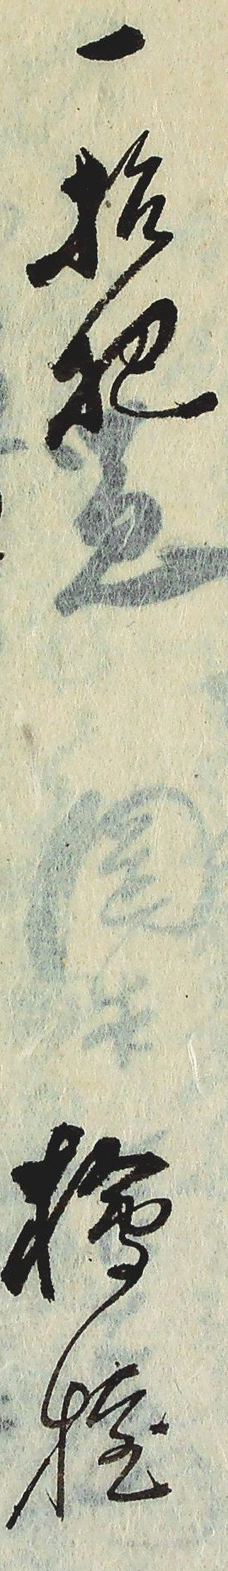一拾把桧檀
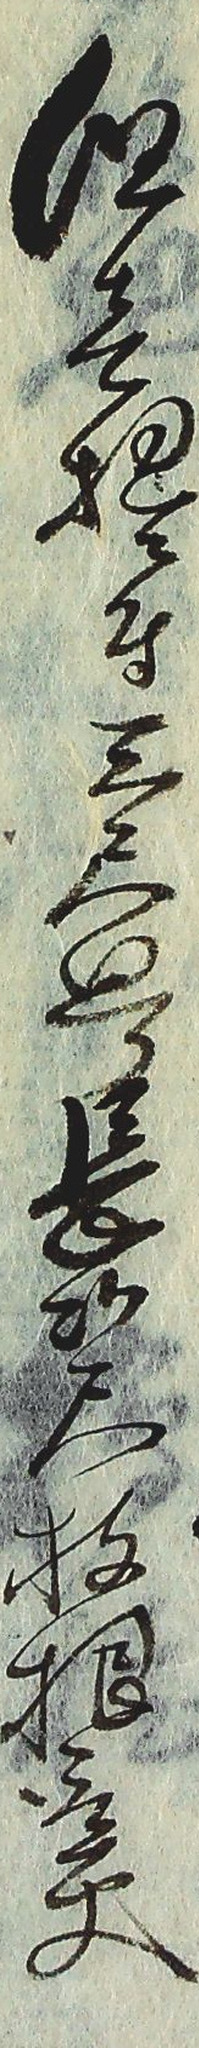但壱把に付三尺廻り長弐尺枝根取交
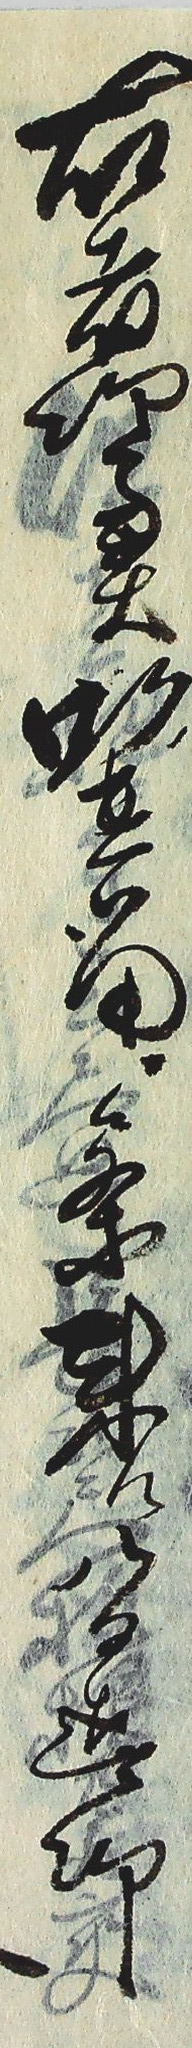右は御奥蚊遣御用に候条来る八日迄に御
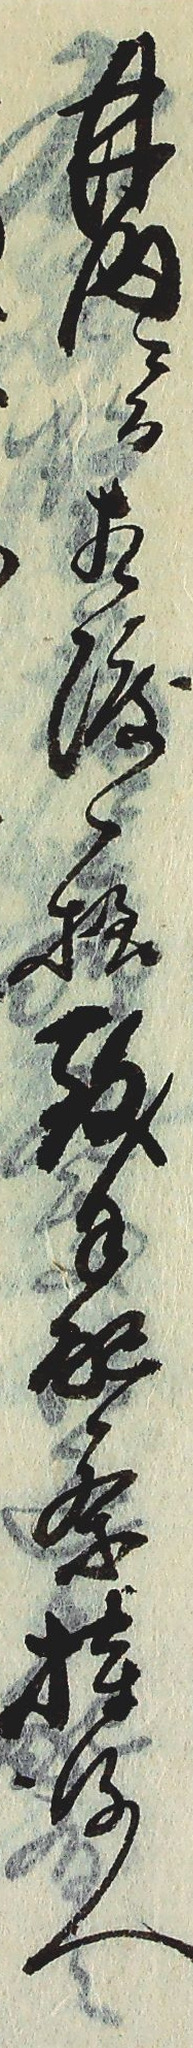林内にて相渡候様致手配候条持役人
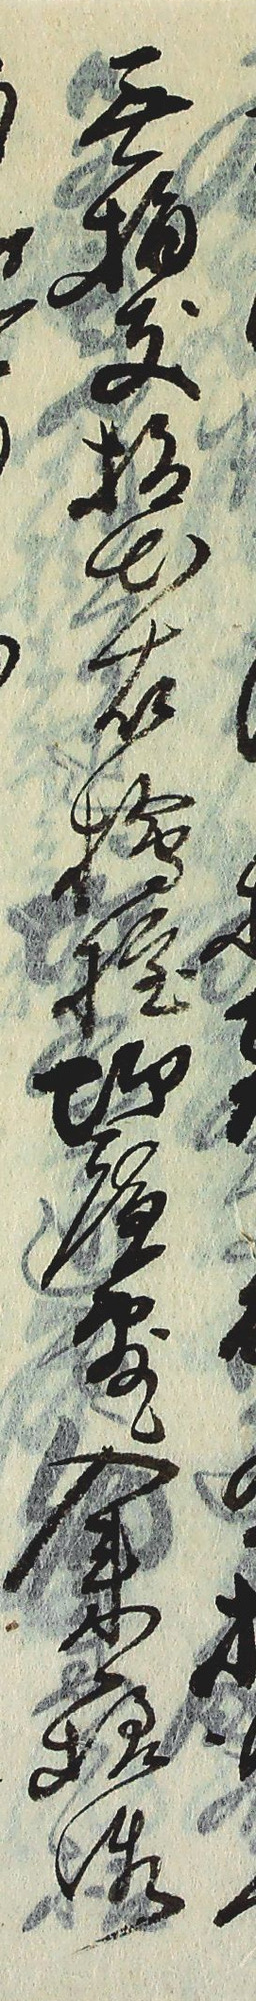無指支指出右桧檀御広敷へ入来候様御
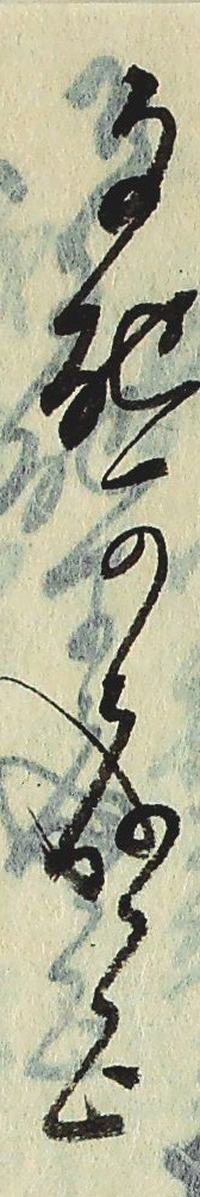手配可被成候以上
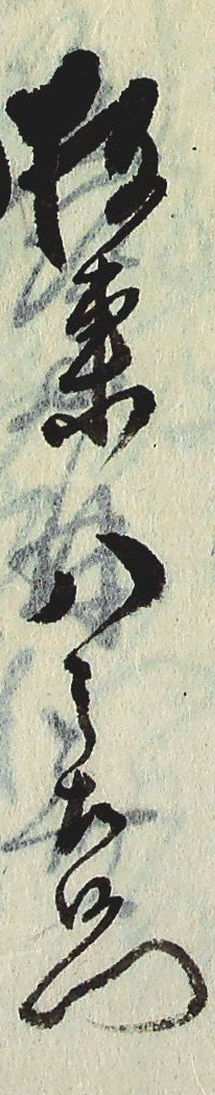板東八郎左衛門
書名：名東郡中諸割賦元帳
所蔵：鳴門教育大学 Naruto University of Education
